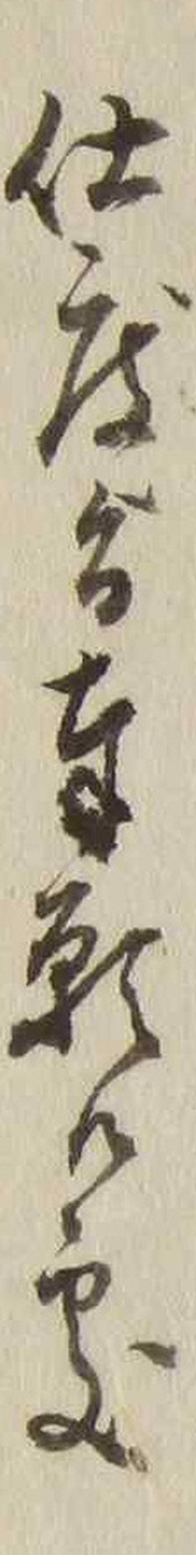仕度旨奉願候処

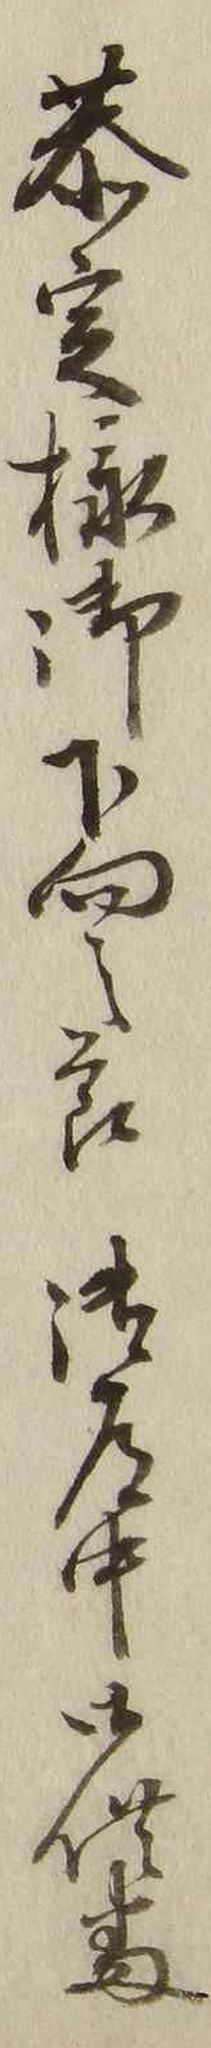恭定様御下向之節御道中御供番
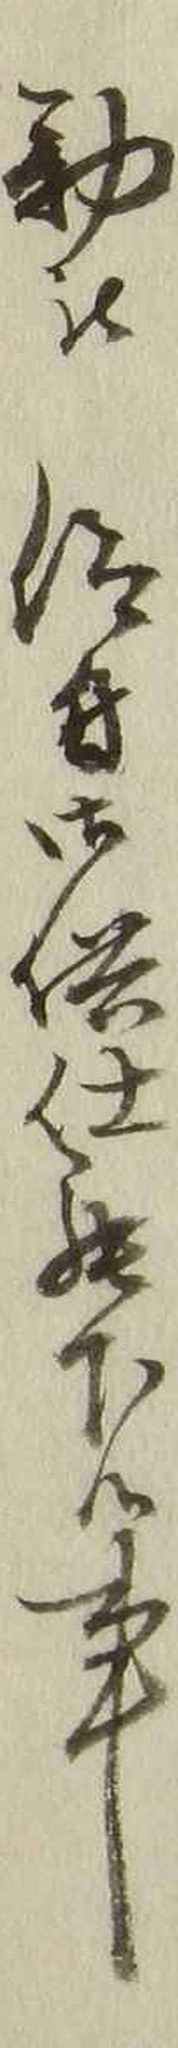勤被仰付御供仕罷下候事
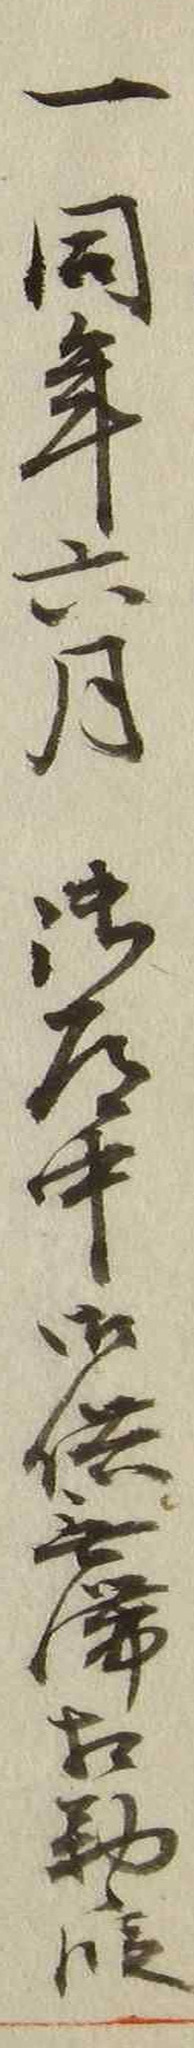一同年六月御道中御供無滞相勤候段
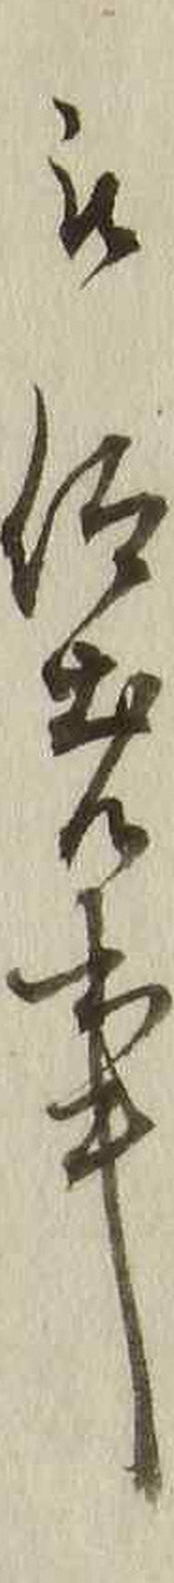被仰出候事
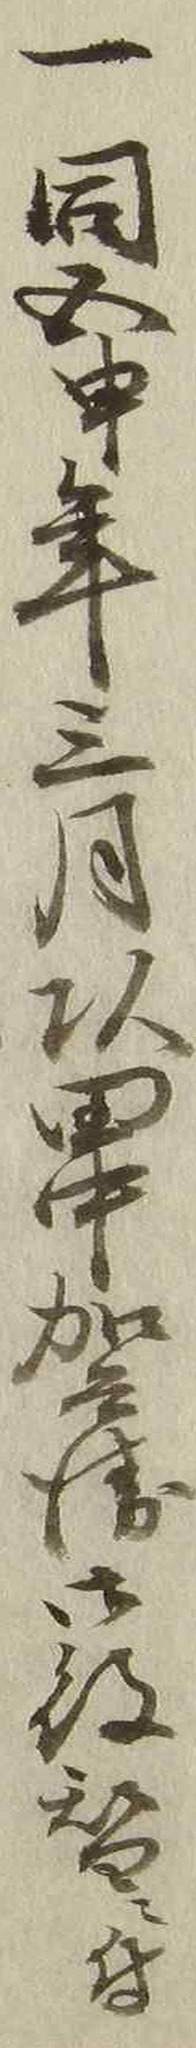一同五申年三月頭田中加兵衛御役替ニ付
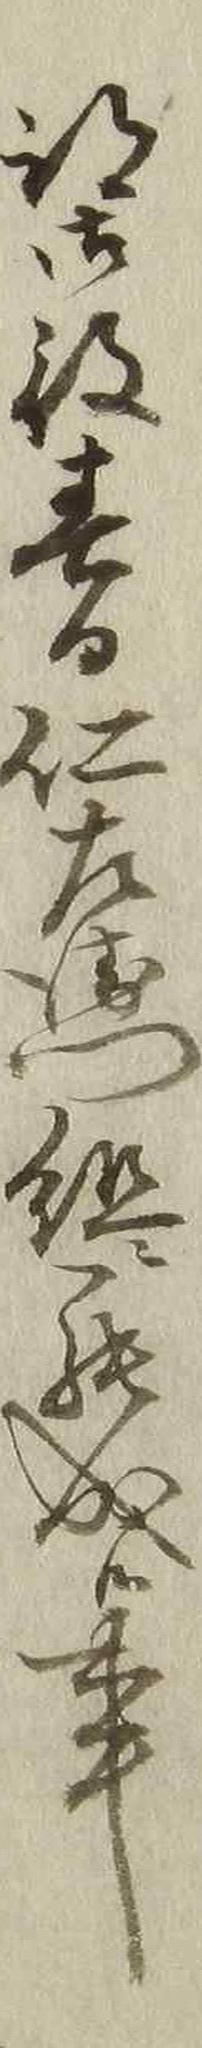跡御役春日仁左衛門組ニ罷成候事
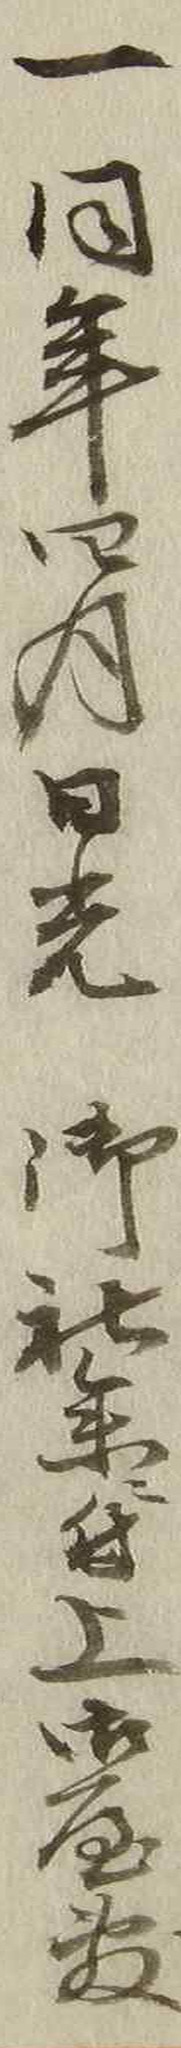一同年四月日光御社参ニ付上御屋敷
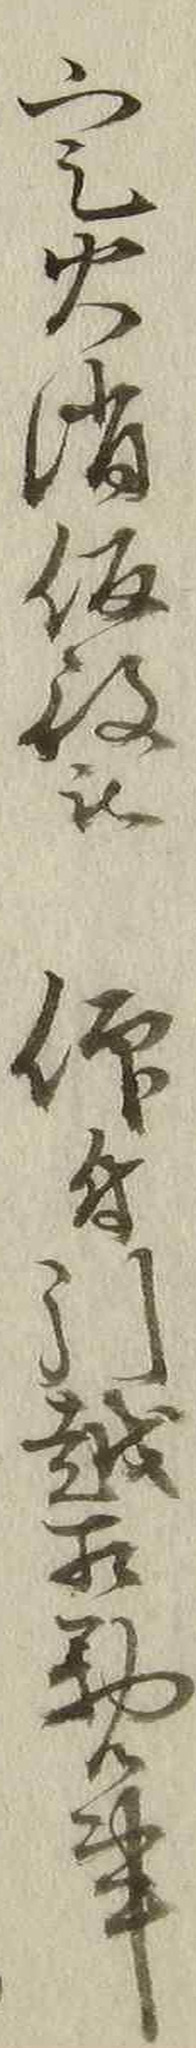定火消仮役被仰付引越相勤候事
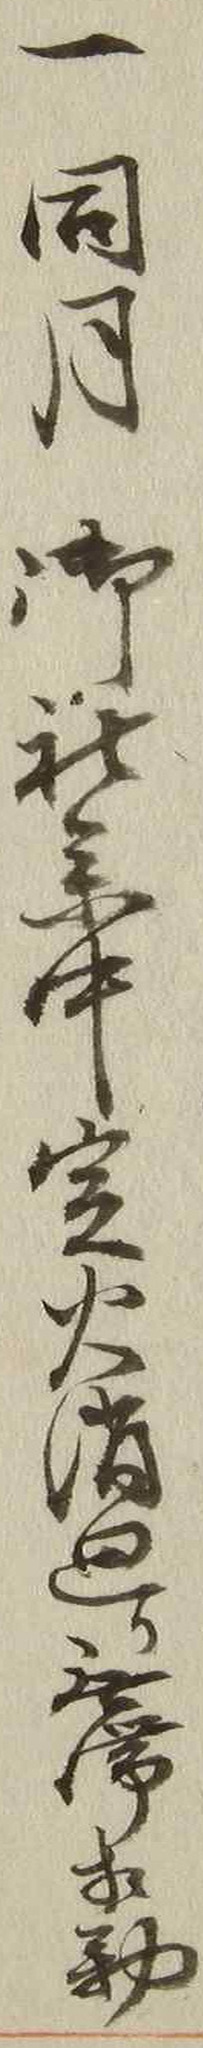一同月御社参中定火消廻り無滞相勤
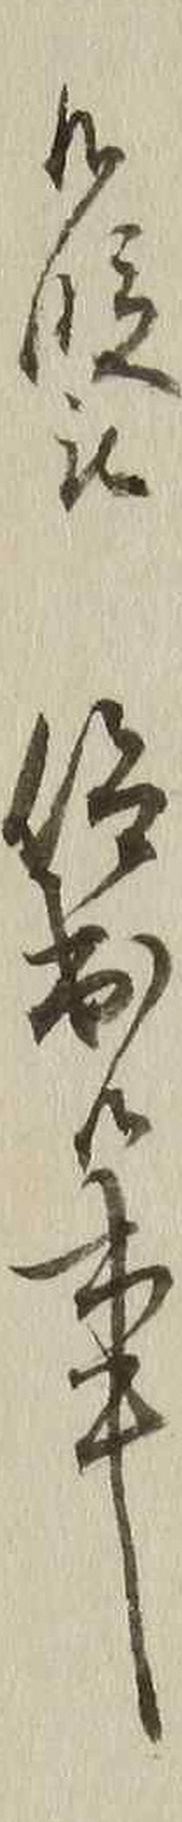候段被仰出候事
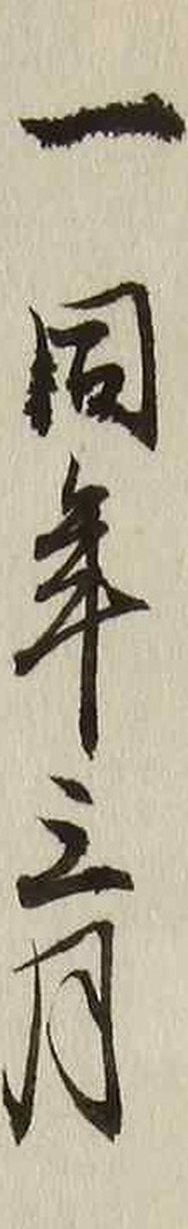一同年三月
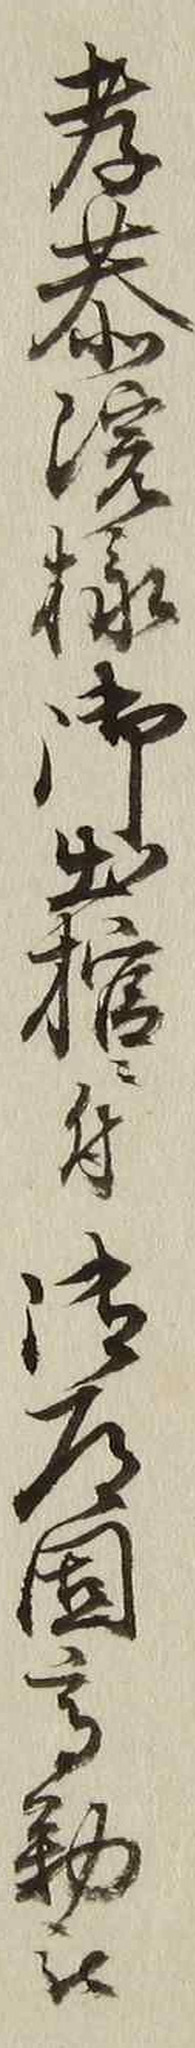孝恭院様御出棺ニ付御道固高勤被
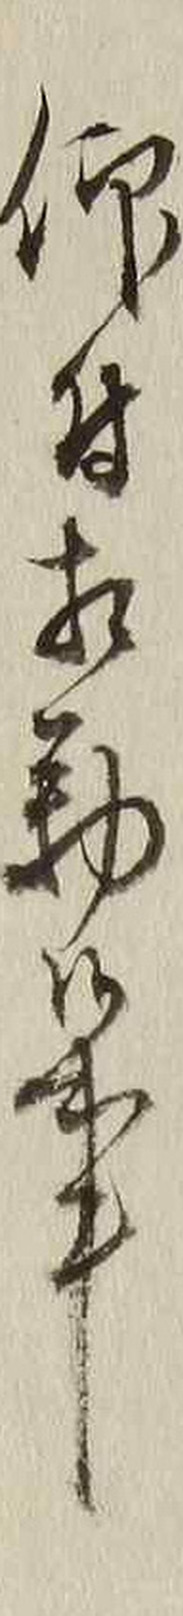仰付相勤候事
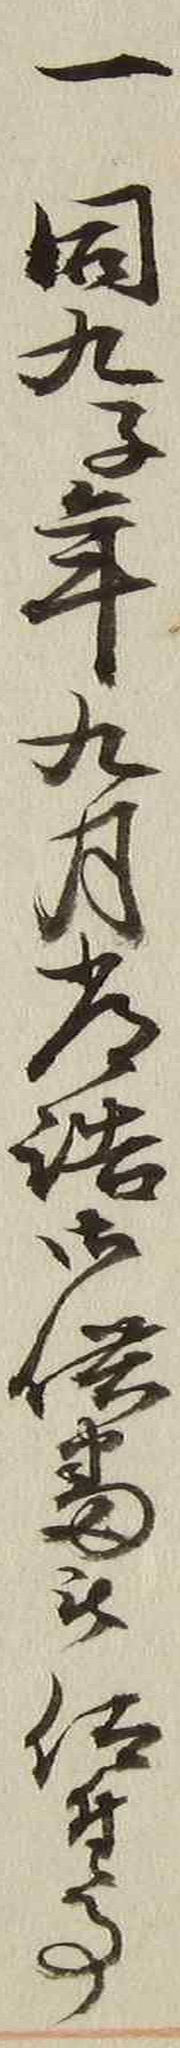一同九子年九月常詰御供番被仰付候事
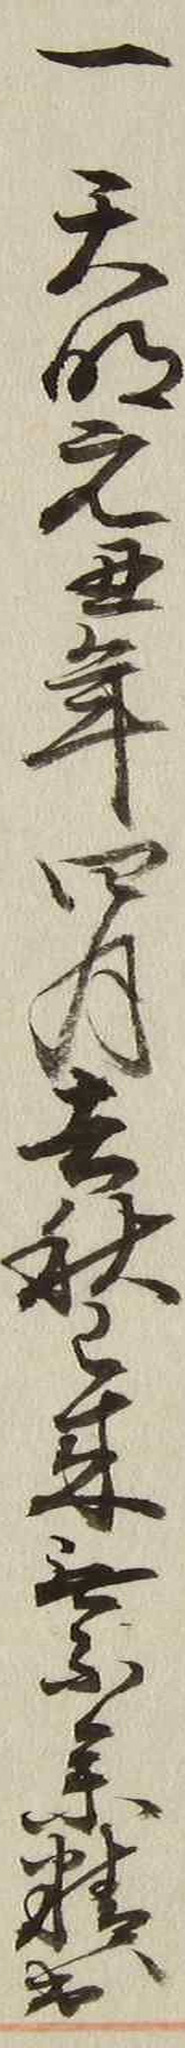一天明元丑年四月去秋已来無不参精出
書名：諸士系譜　巻之23　い之部23
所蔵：会津若松市立会津図書館
